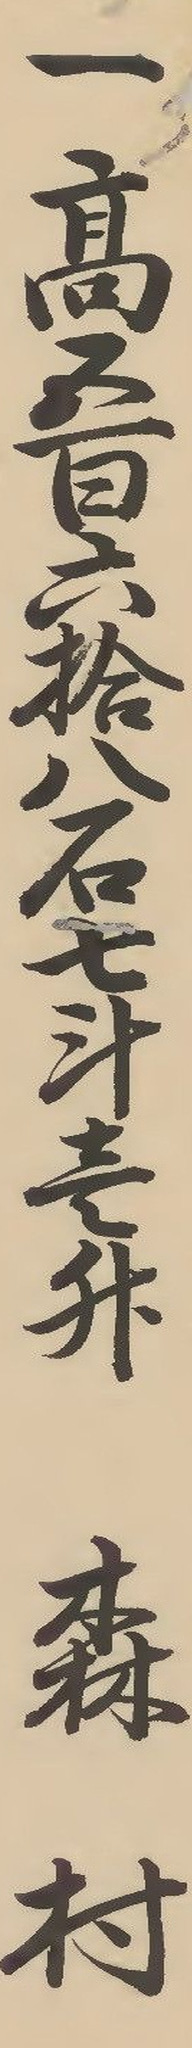一高五百六拾八石七斗壱升森村
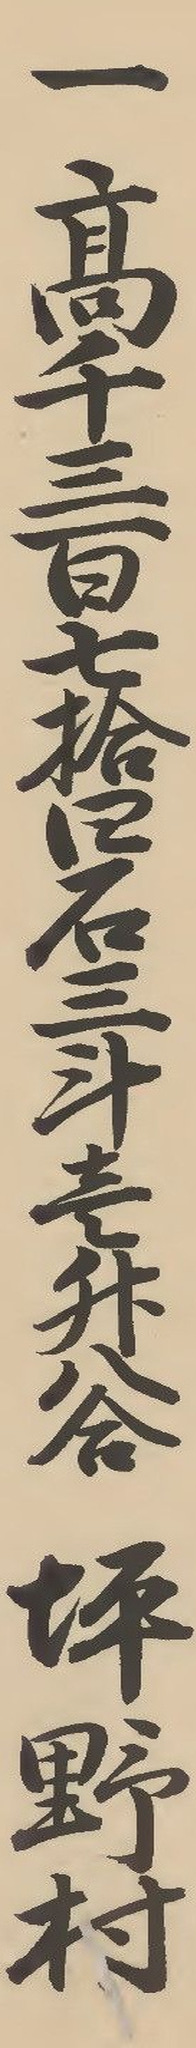一高千三百七拾四石三斗壱升八合坪野村
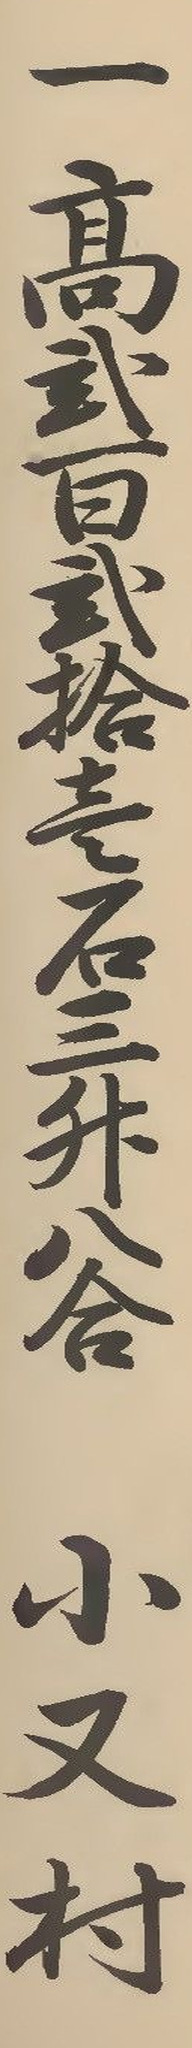一高弐百弐拾壱石三升八合小又村
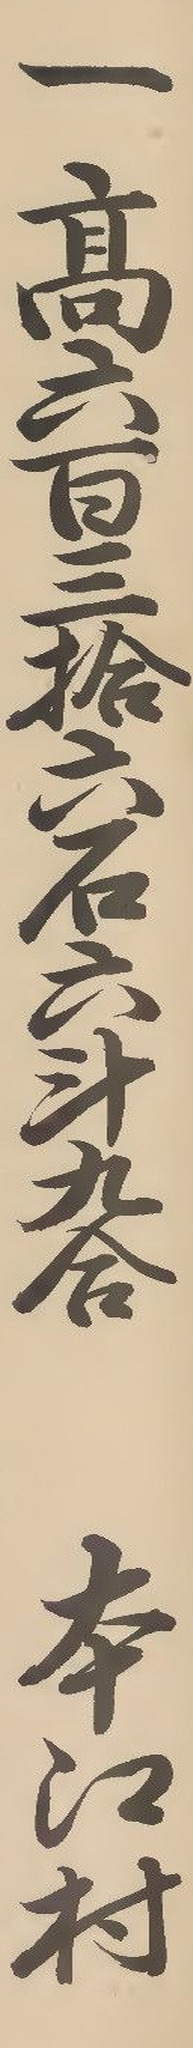一高六百三拾六石六斗九合本江村
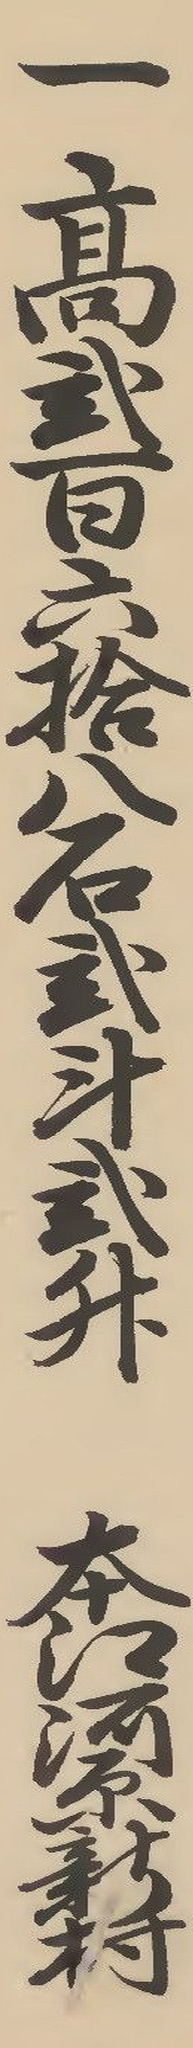一高弐百六拾八石弐斗弐升本江河原新村
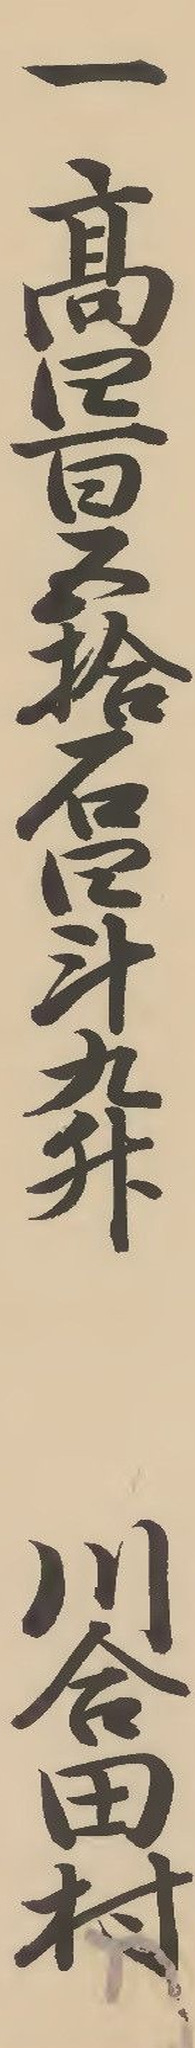一高四百五拾石四斗九升川合田村
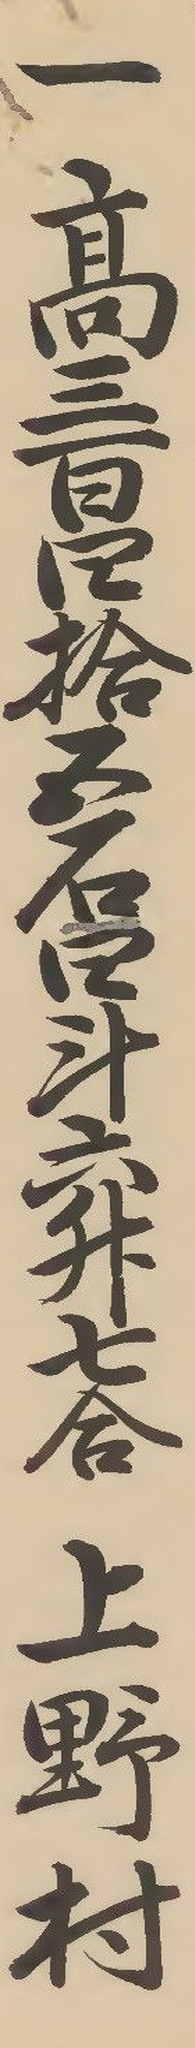一高三百四拾五石四斗六升七合上野村

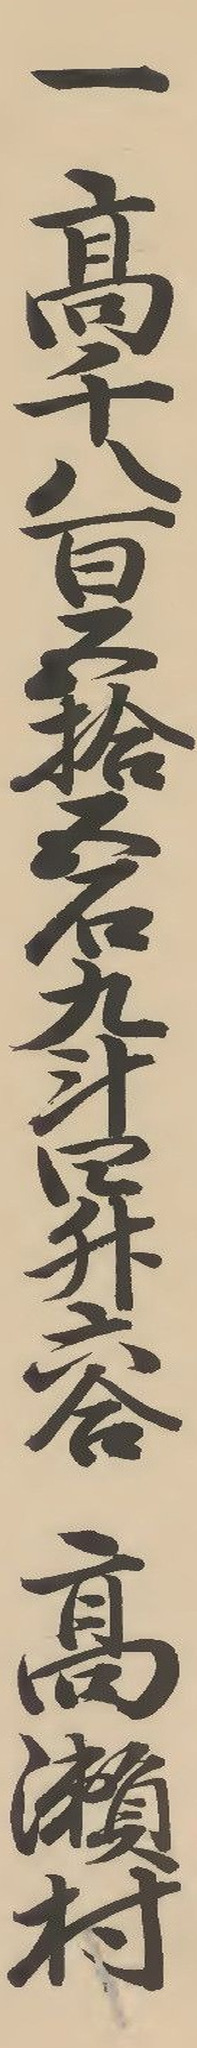一高千八百五拾五石九斗四升六合高瀬村
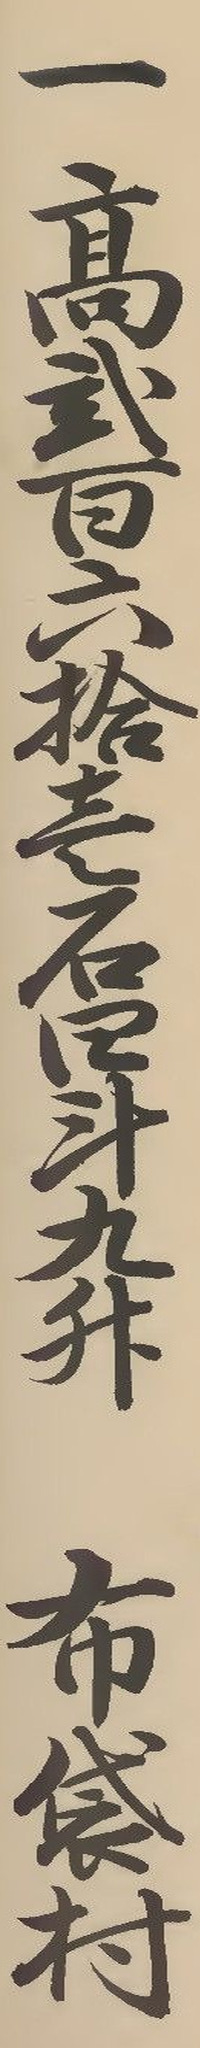一高弐百六拾壱石四斗九升布袋村
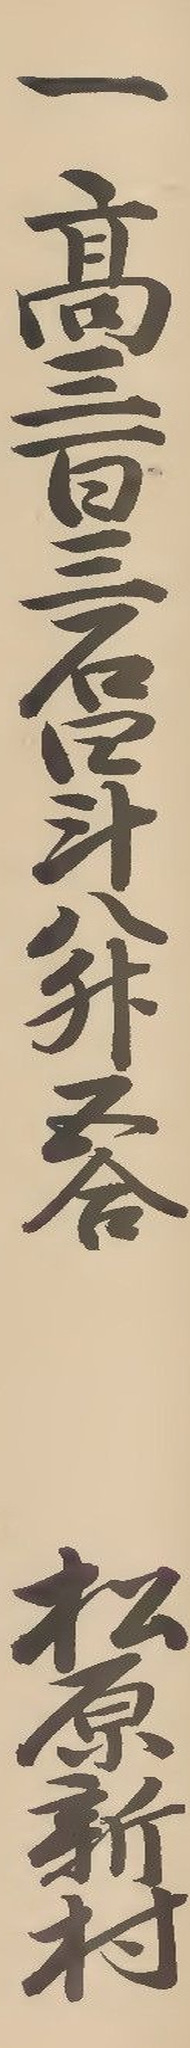一高三百三石四斗八升五合松原新村
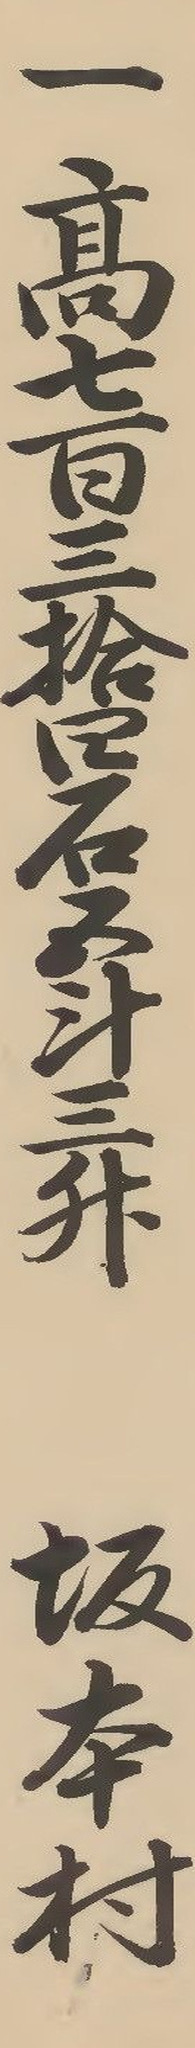一高七百三拾四石五斗三升坂本村
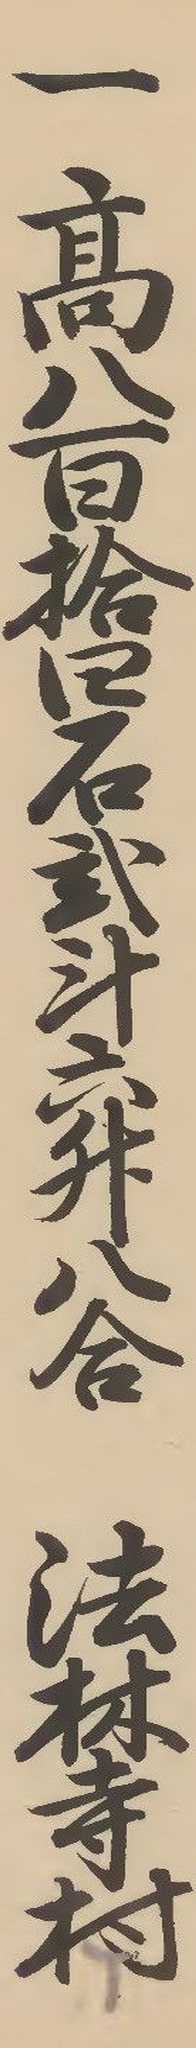一高八百拾四石弐斗六升八合法林寺村
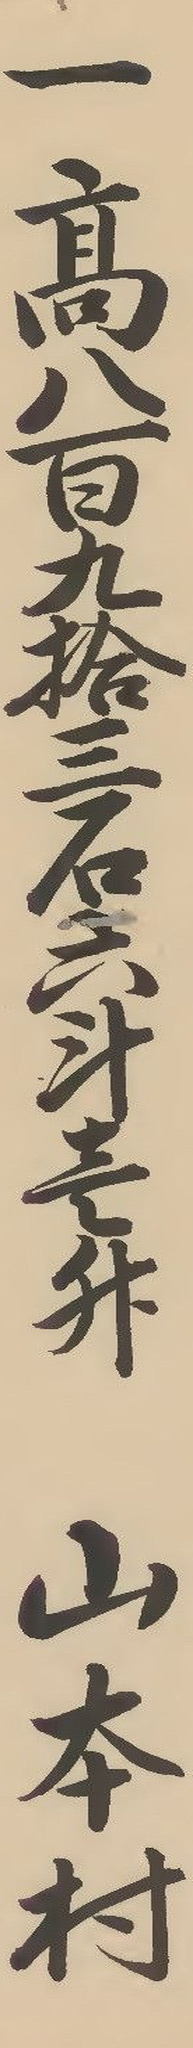一高八百九拾三石六斗壱升山本村

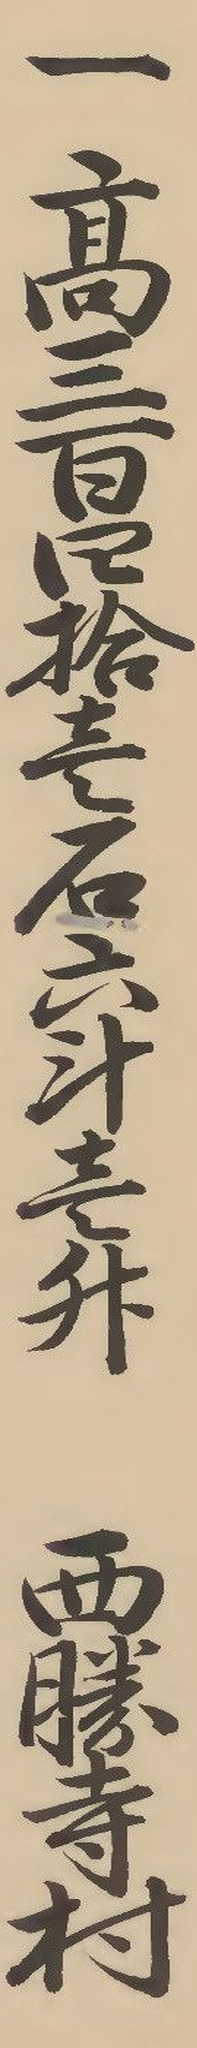一高三百四拾壱石六斗壱升西勝寺村
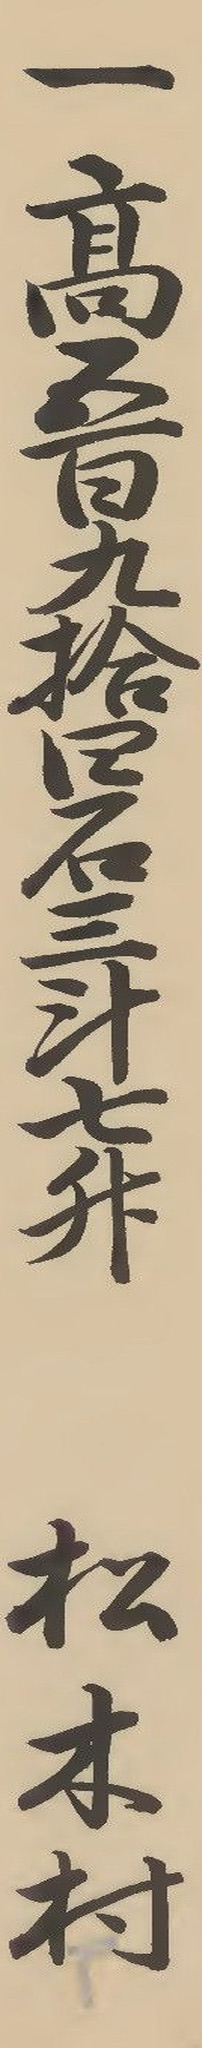一高五百九拾四石三斗七升松木村
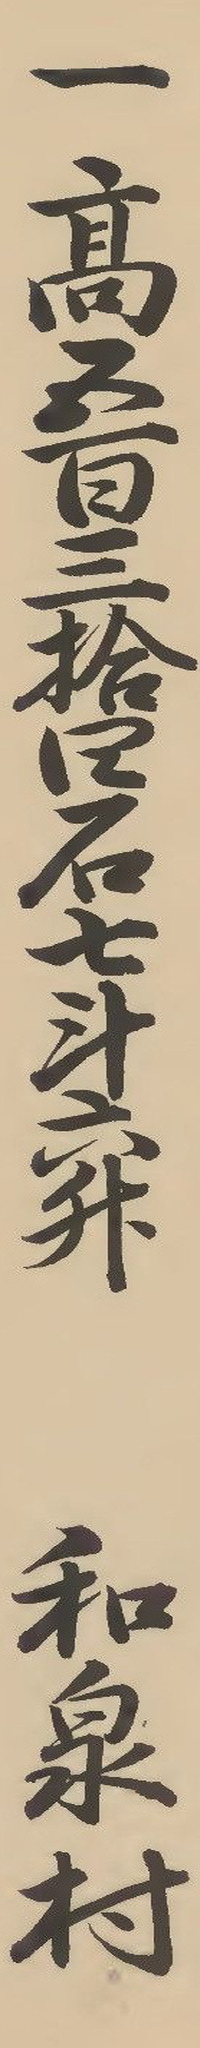一高五百三拾四石七斗六升和泉村
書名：越中国郷帳
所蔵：国立公文書館 National Archives of Japan
